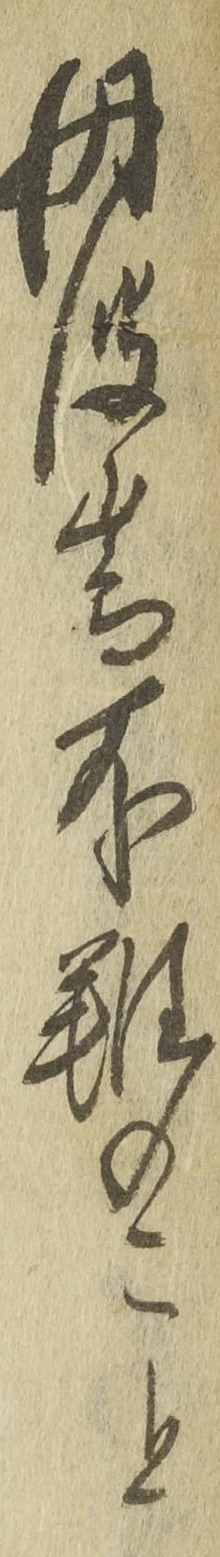丹波嶋不難のこと
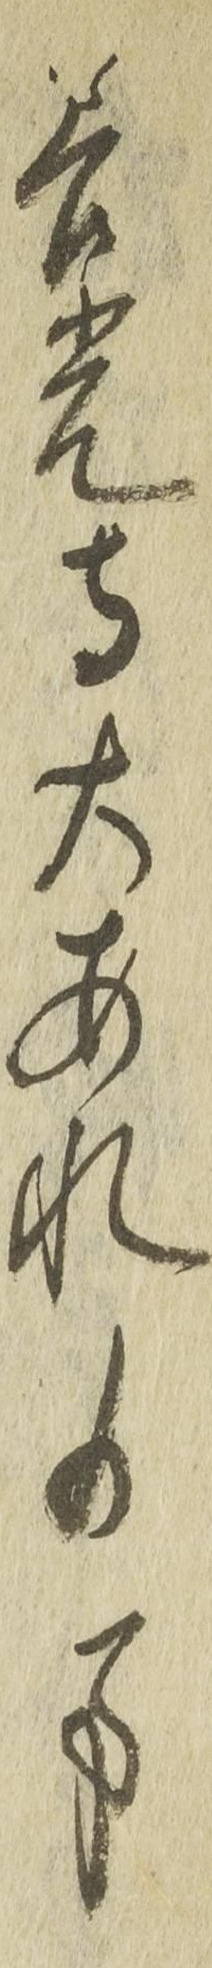善光寺大あれの事
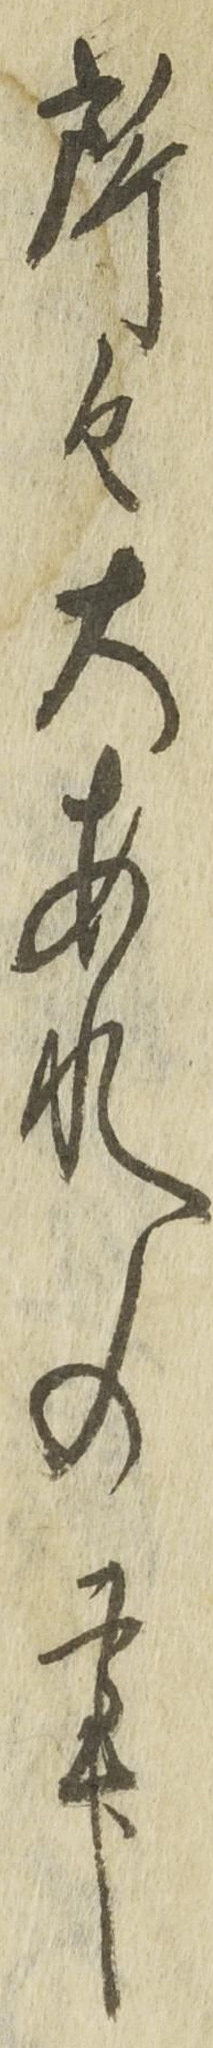所々大あれの事
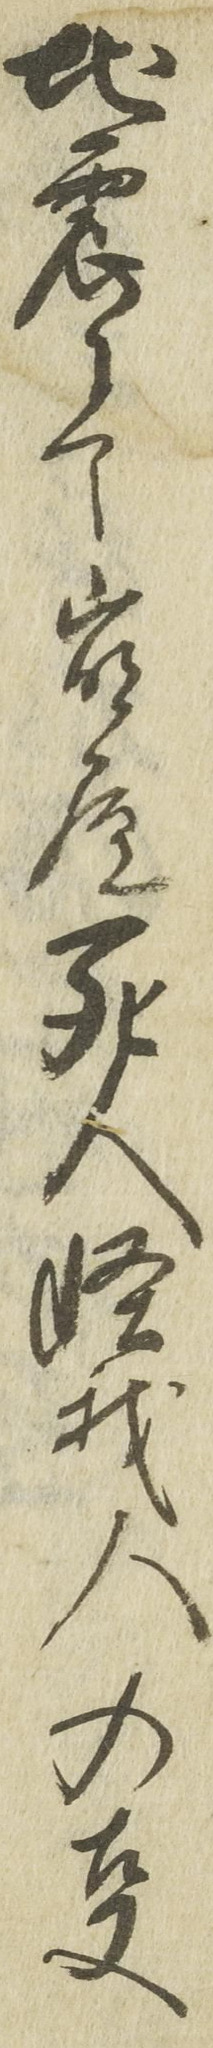地震にて崩屋死人怪我人の事
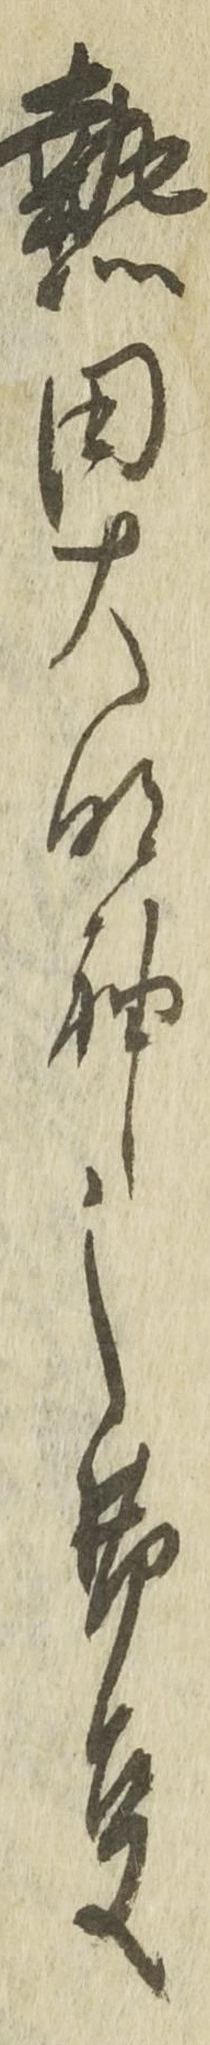熱田大明神之御事
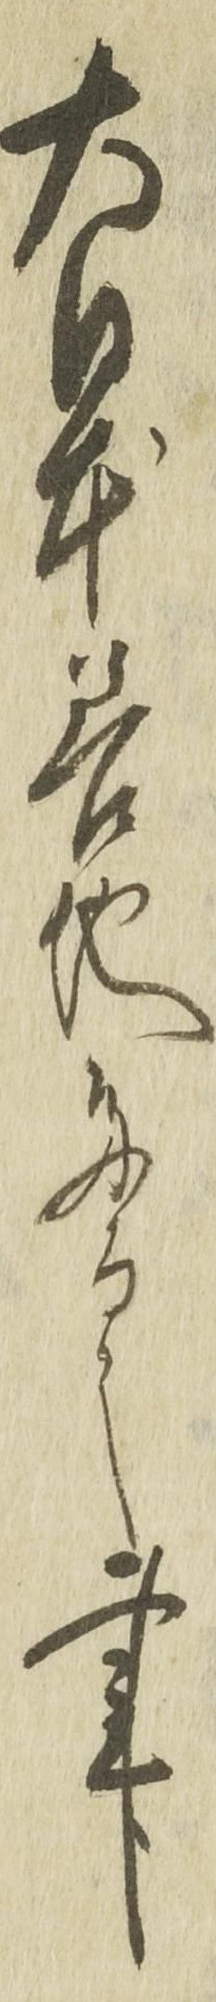大日本善地たる之事
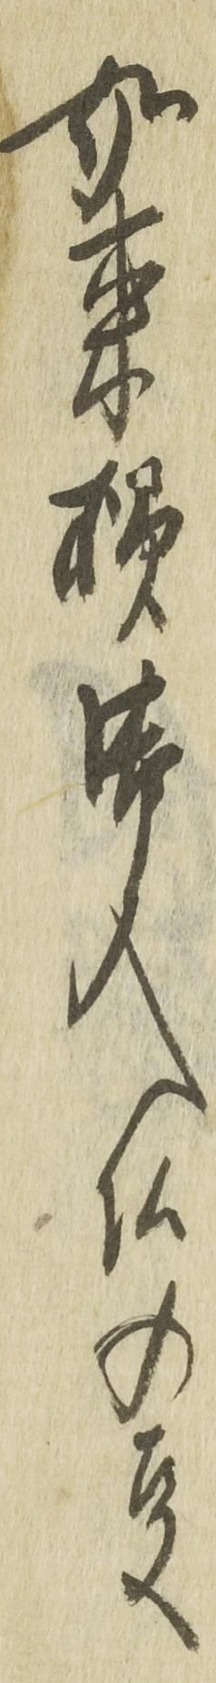如来様御入仏の事
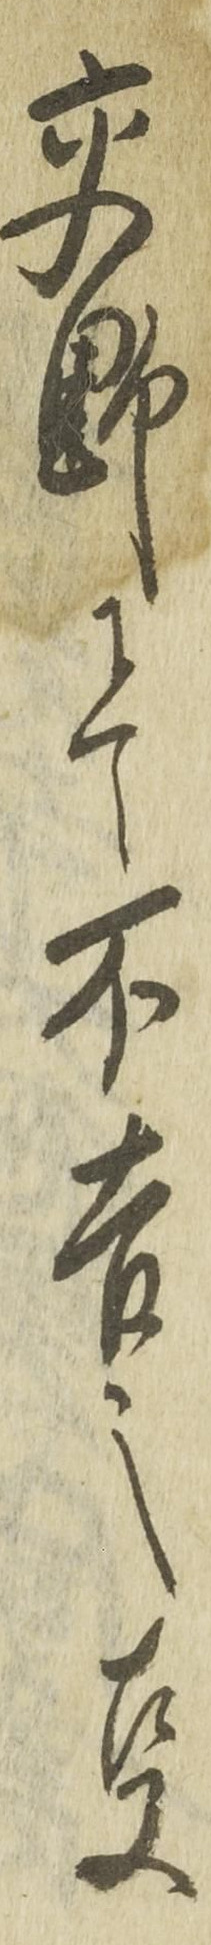交野にて不吉之事
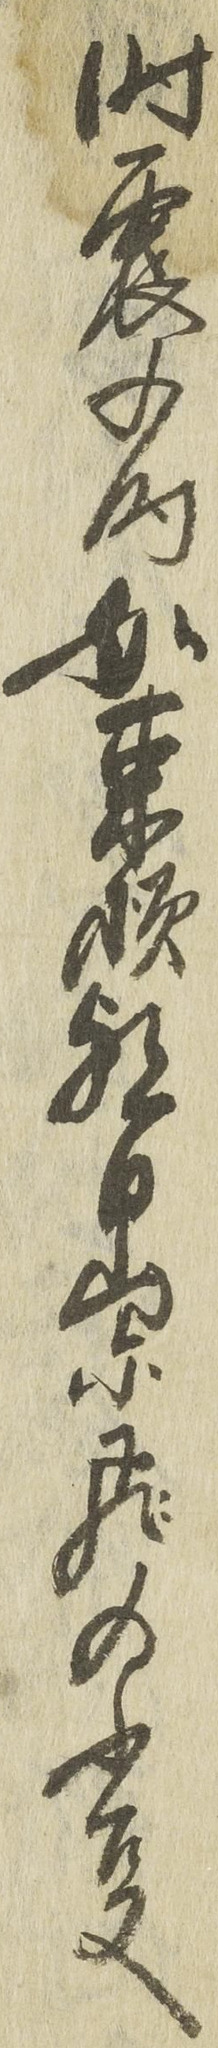時震の時如来様朝日山に飛給ふ事
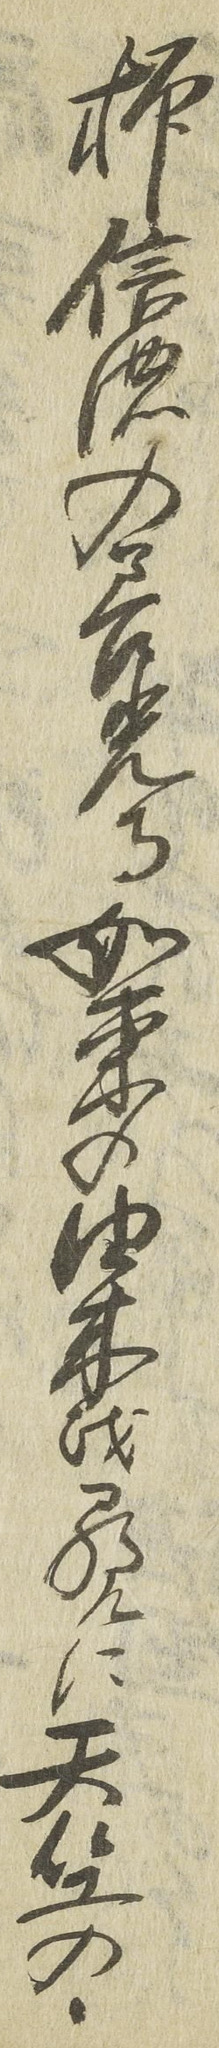抑信濃の善光寺如来の由来を尋んに天竺の
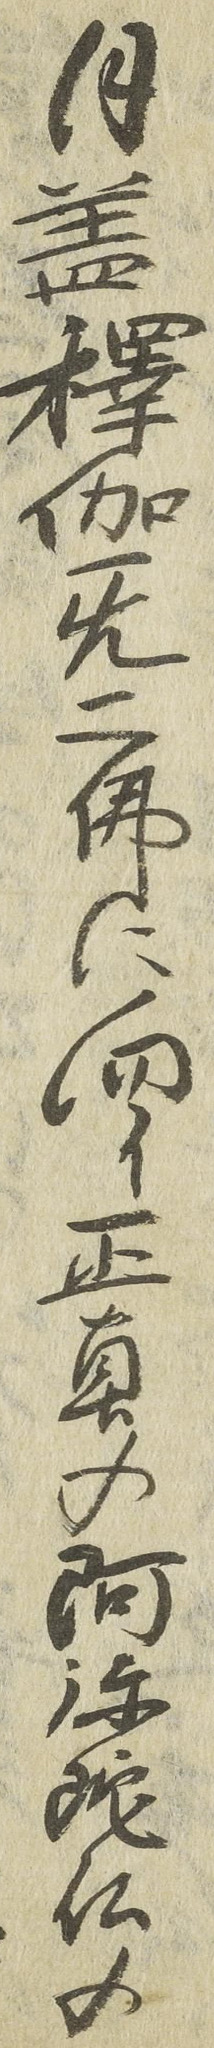月蓋釈伽む二仏に向イ正真の阿弥陀仏の
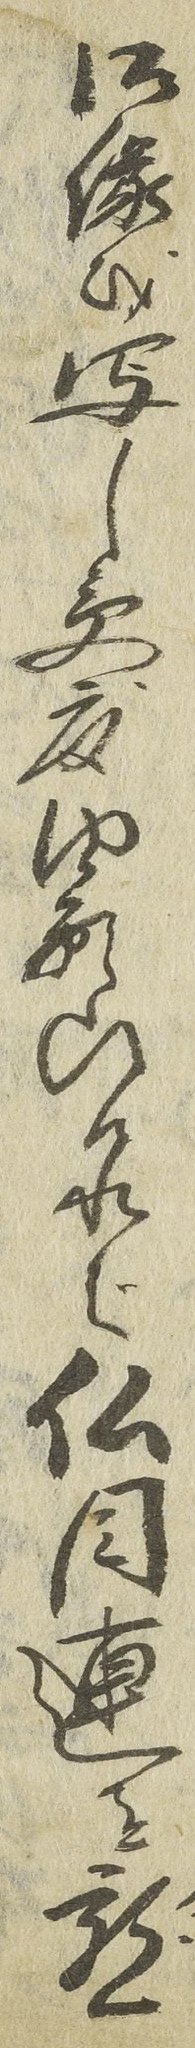御像を写し受度由願ひければ仏目連を龍
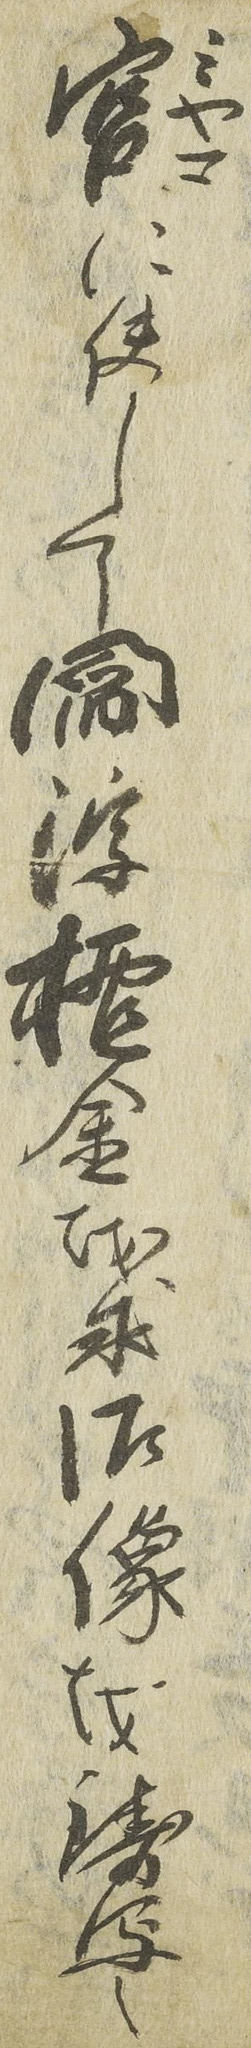宮に使して閻浮檀金を求御像を鋳写し
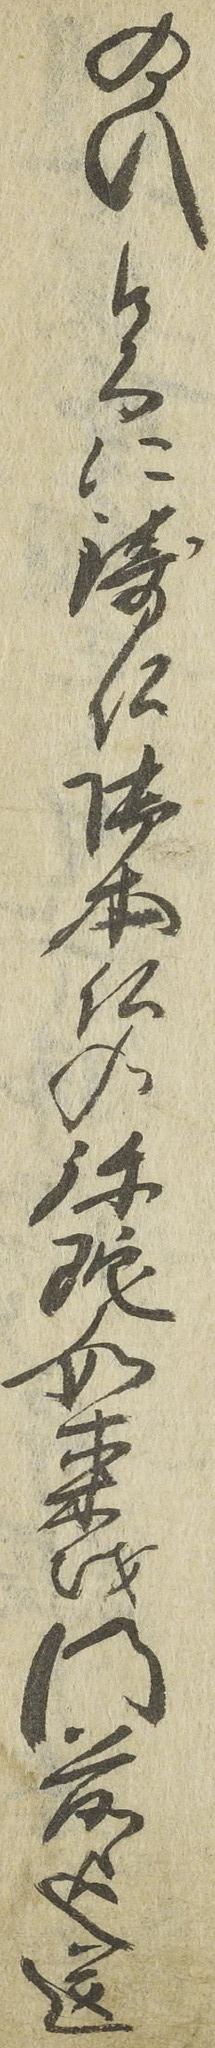給ひけるに鋳仏御本仏の弥陀如来を門前迄送
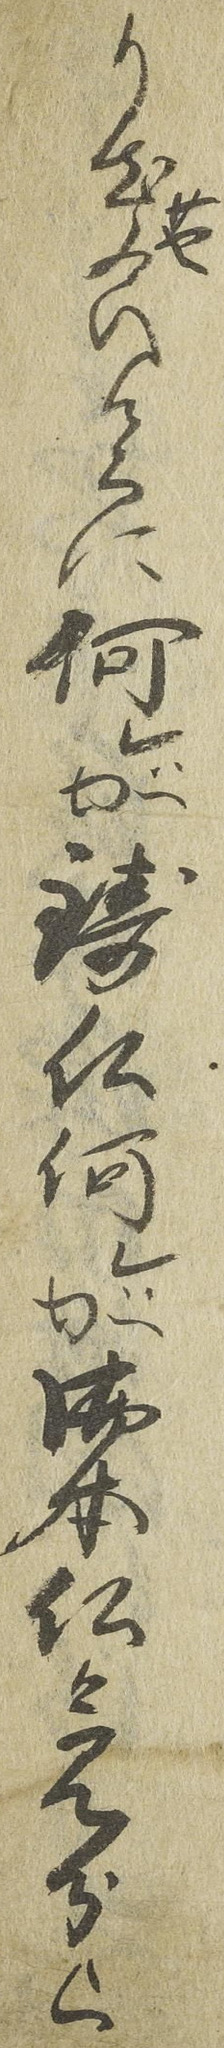り出サせ給ひけるに何レが鋳仏何レが御本仏と見分ら

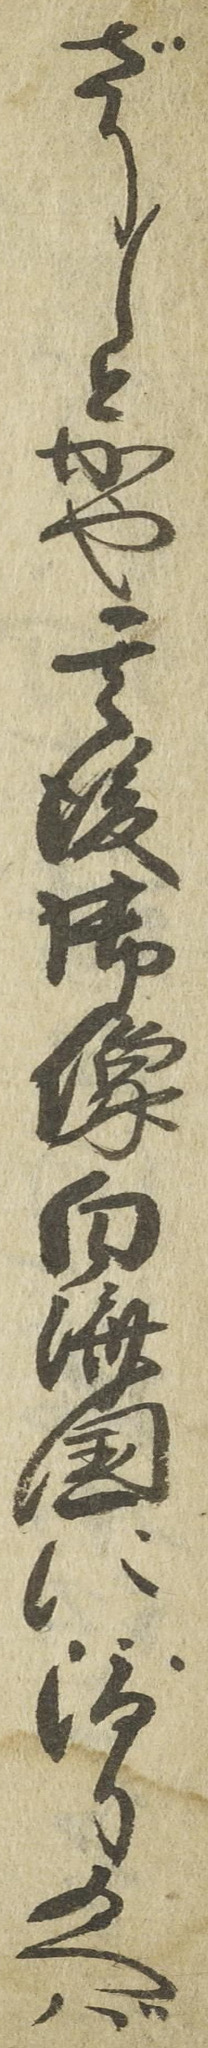ざりしとかや其後御像百済国に渡り給へば
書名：善光寺地震聞書
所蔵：東京大学地震研究所図書室 Earthquake Research Institute Library, The University of Tokyo, JAPAN
